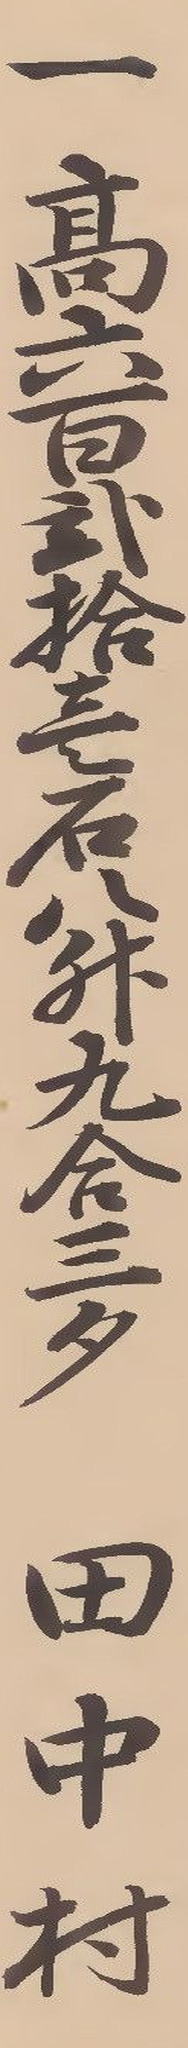一高六百弐拾壱石八升九合三勺田中村
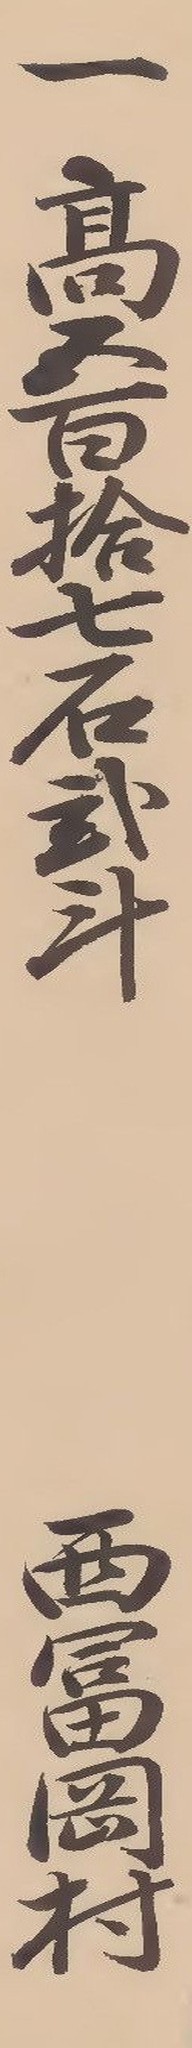一高五百拾七石弐斗西冨岡村
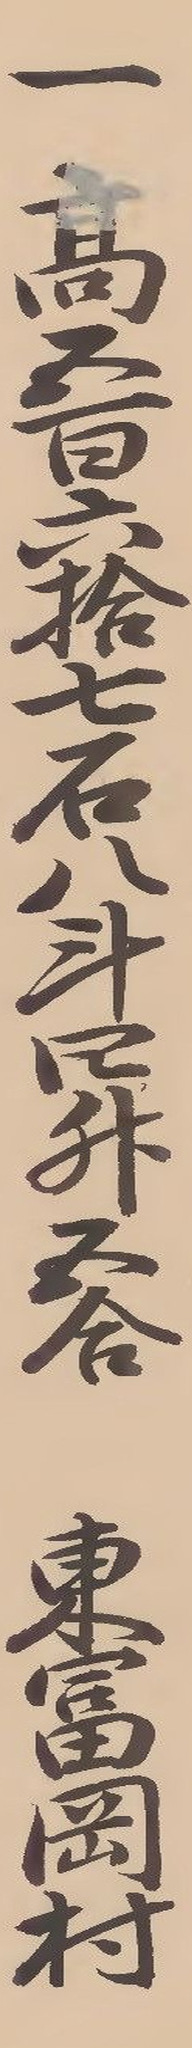一高五百六拾七石八斗四升五合東冨岡村
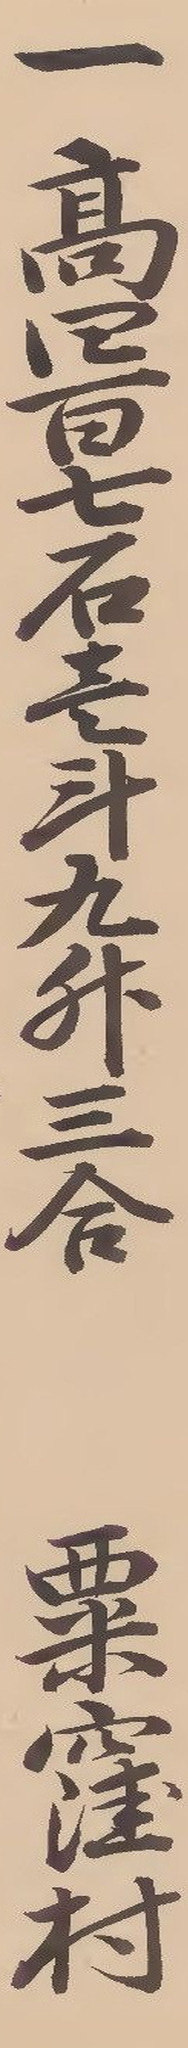一高四百七石壱斗九升三合粟窪村

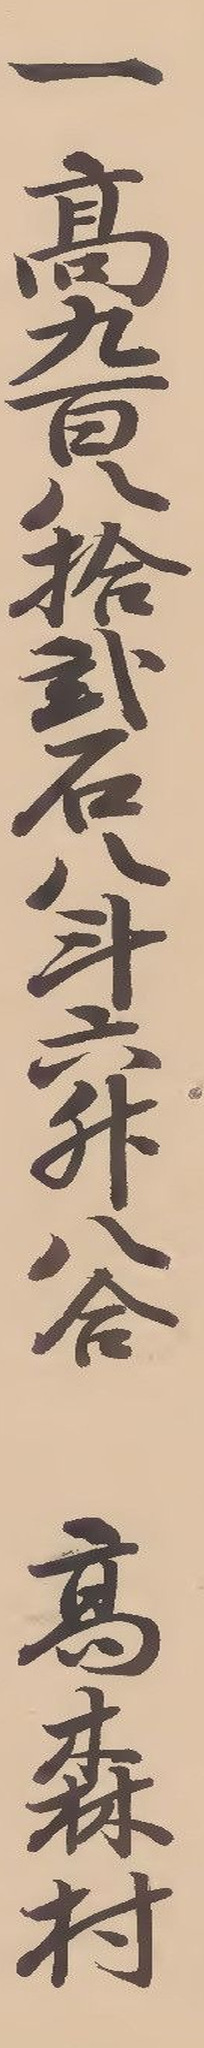一高九百八拾弐石八斗六升八合高森村
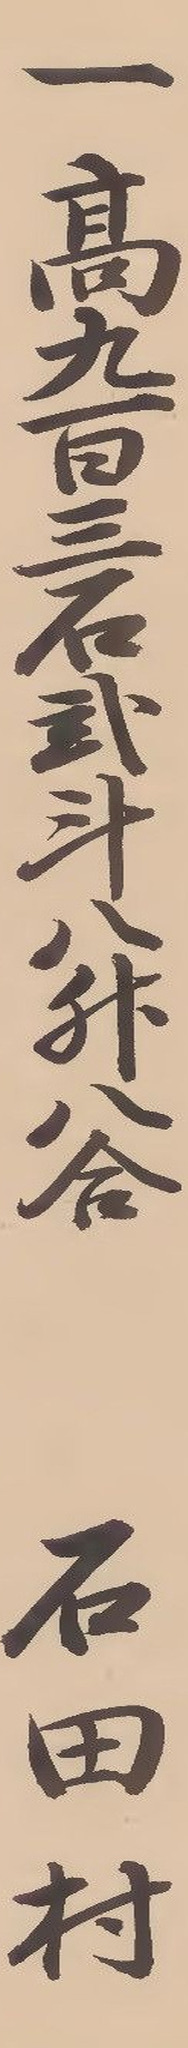一高九百三石弐斗八升八合石田村
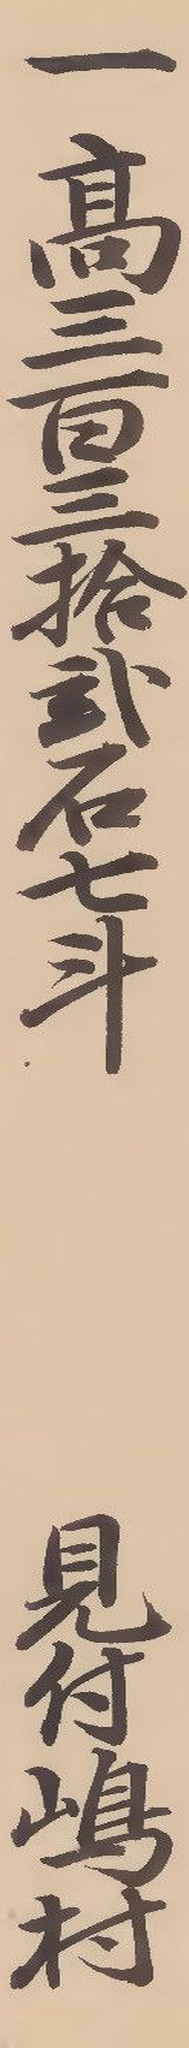一高三百三拾弐石七斗見付嶋村
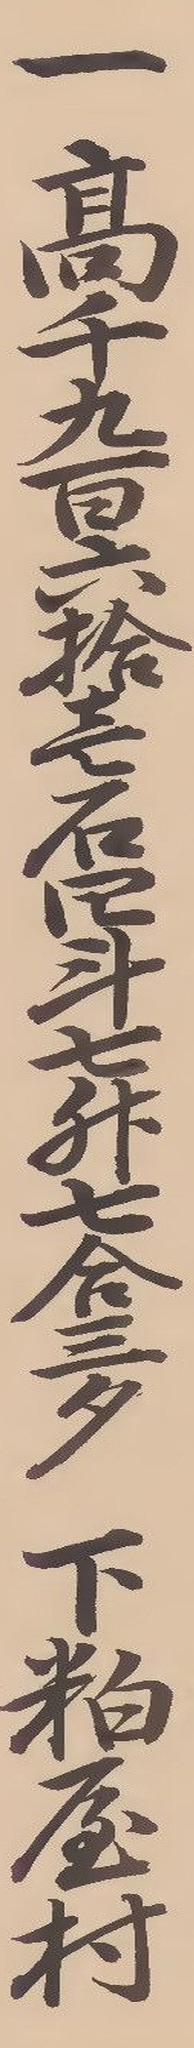一高千九百六拾壱石四斗七升七合三勺下粕屋村
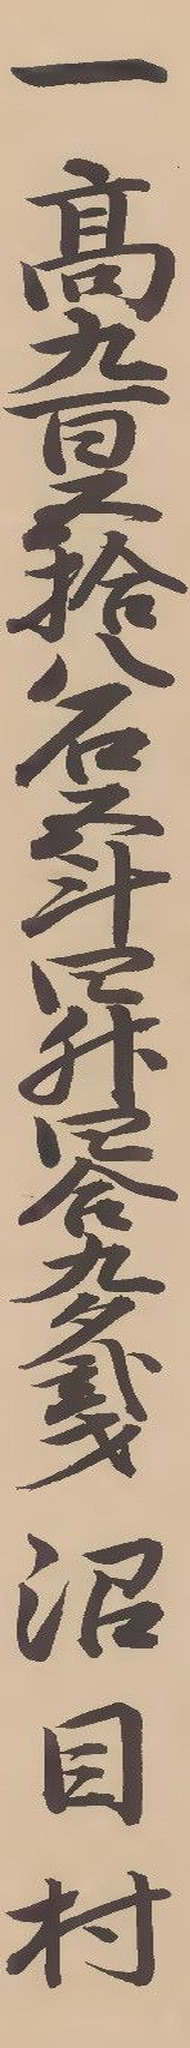一高九百五拾八石五斗四升四合九勺弐才沼目村
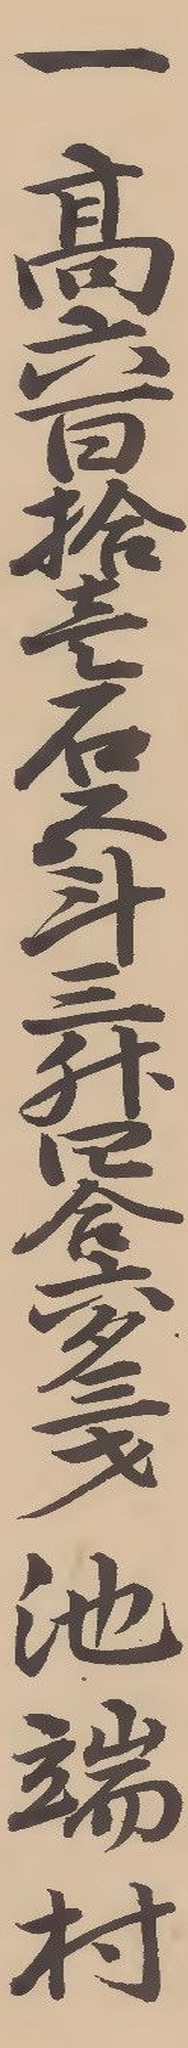一高六百拾壱石五斗三升四合六勺三才池端村
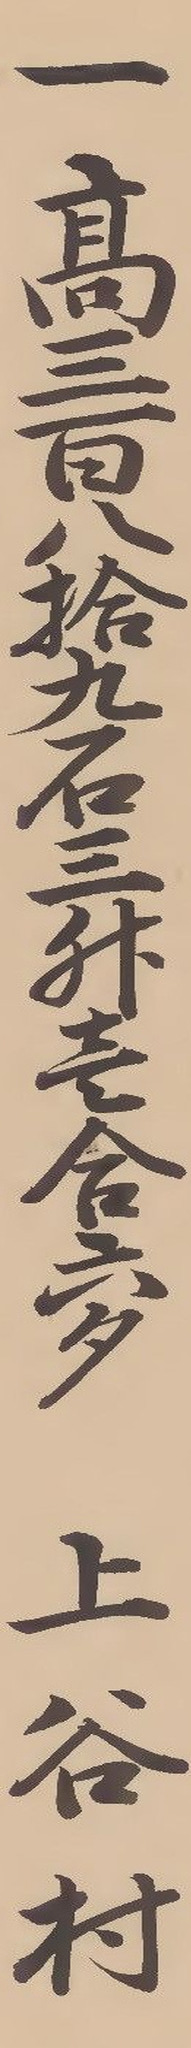一高三百八拾九石三升壱合六勺上谷村
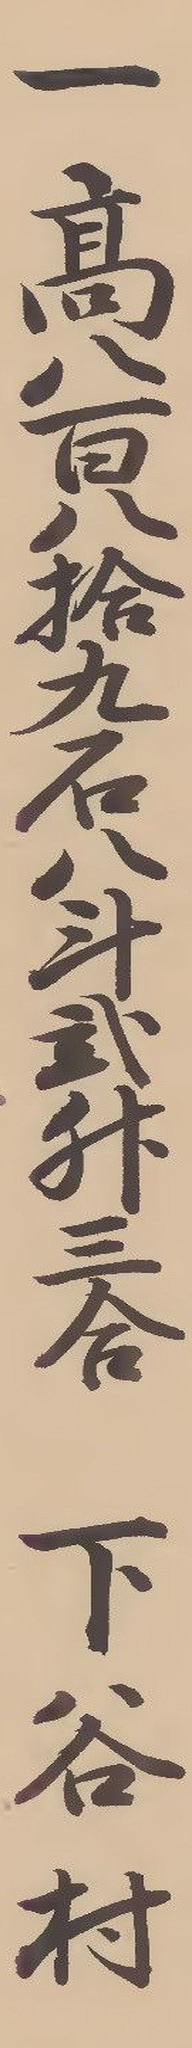一高八百八拾九石八斗弐升三合下谷村

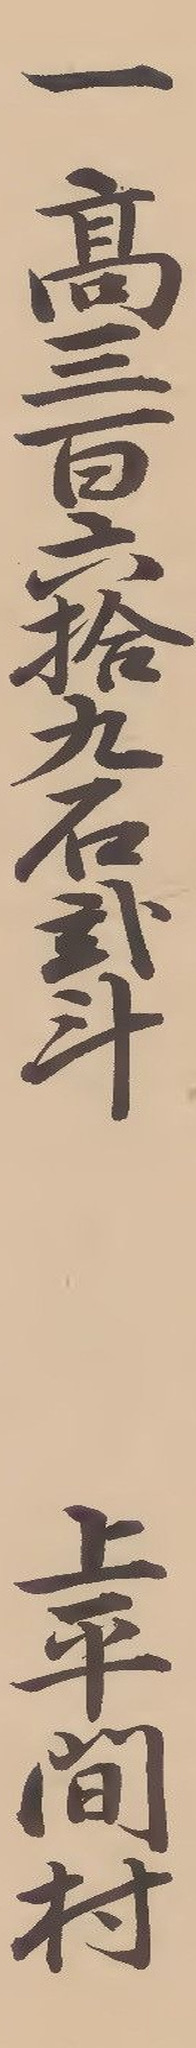一高三百六拾九石弐斗上平間村
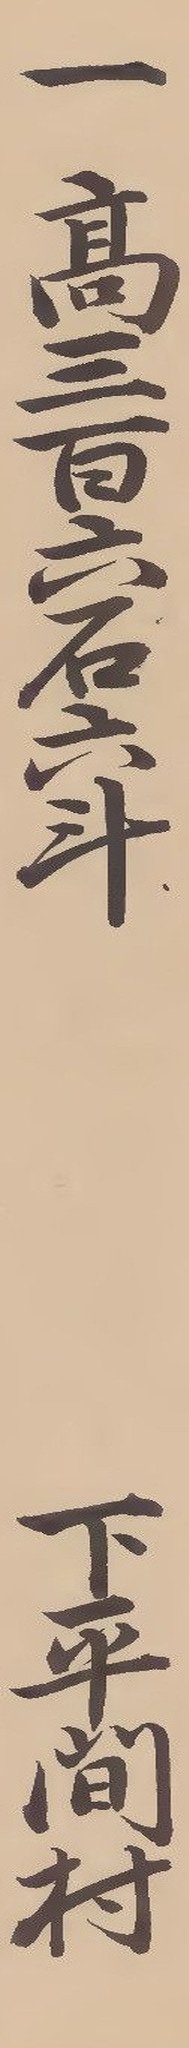一高三百六石六斗下平間村
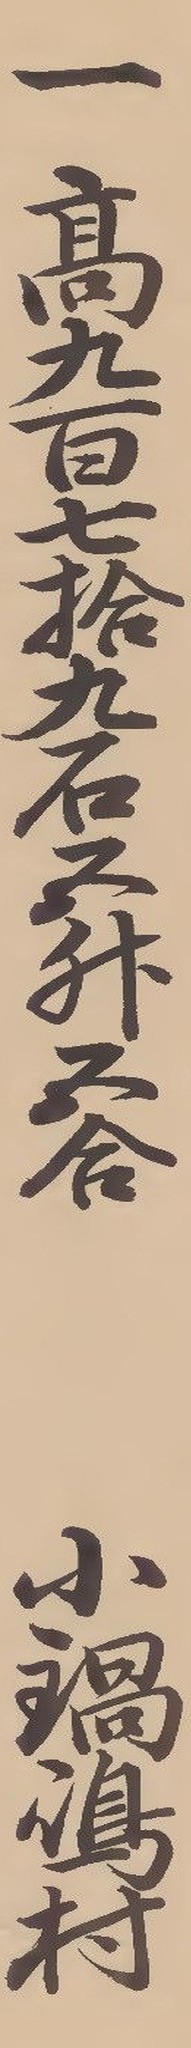一高九百七拾九石五升五合小鍋嶋村
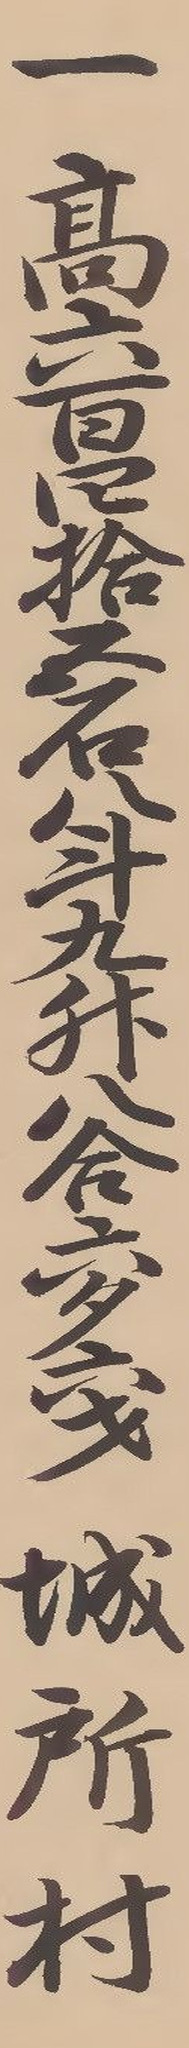一高六百四拾五石八斗九升八合六勺六才城所村
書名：相模国郷帳
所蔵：国立公文書館 National Archives of Japan
